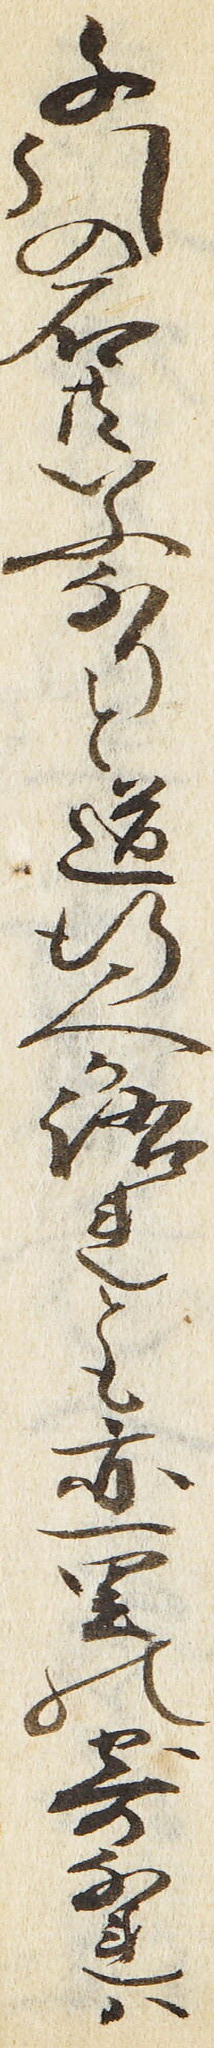千引の石共いふなりと道行人か語れとも亦一里の寄なれは
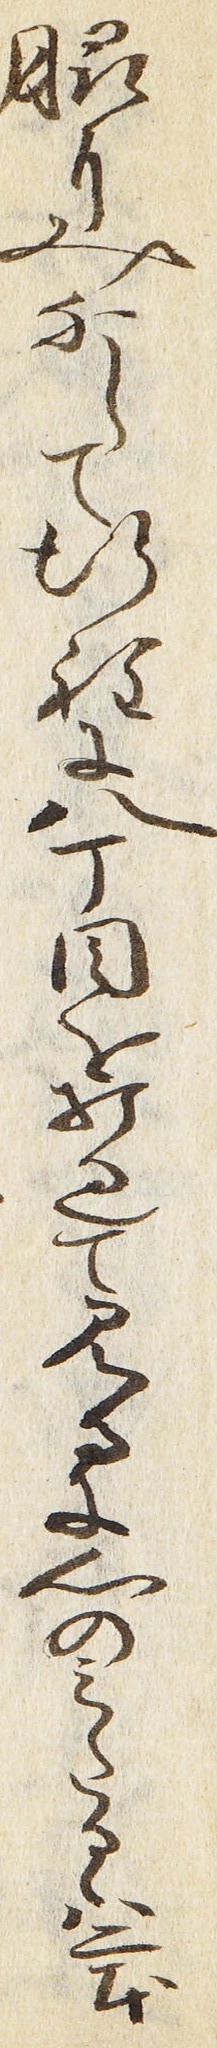脇にみなして行程に八丁目を打過て見るに心のみたるゝは二本
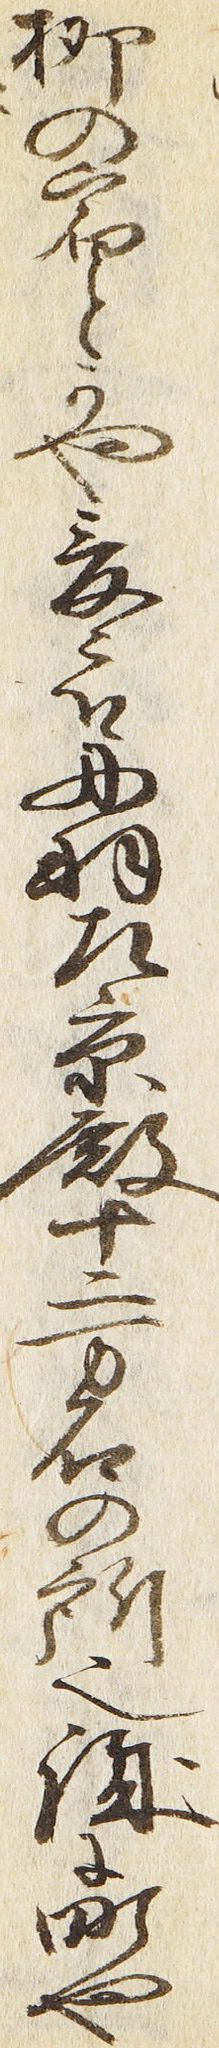柳の宿とかや爰こそ丹羽左京殿十二万石の所也誠に町や
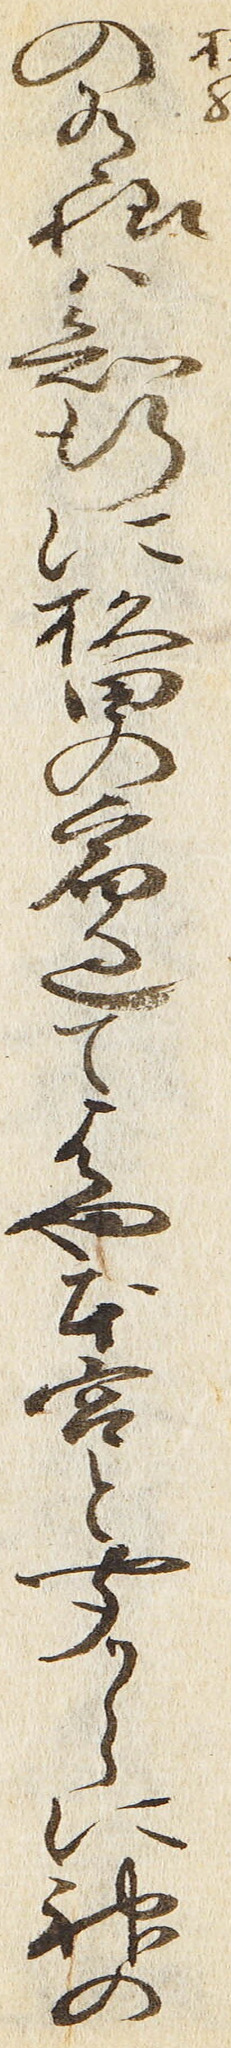の有様ハ知行に杉田の宿過てはや本宮と聞からに神の
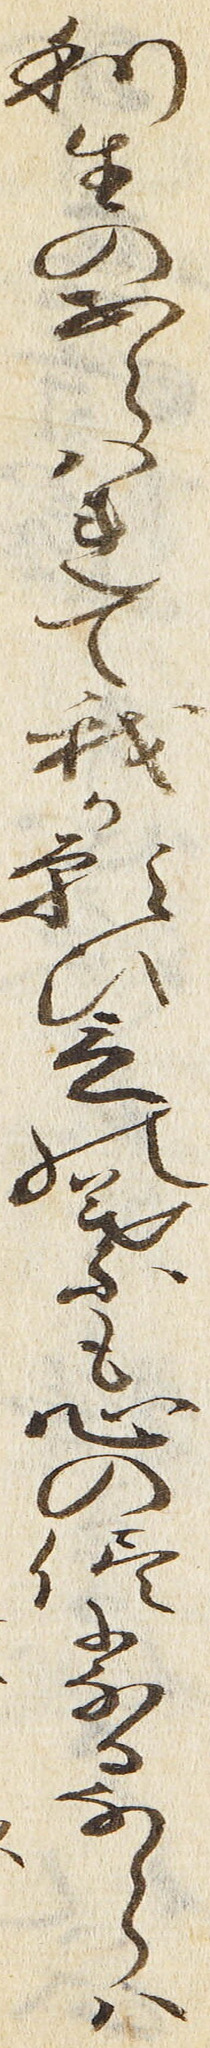利生のあらはれて我か願ひ言の葉も心の儘になるならは
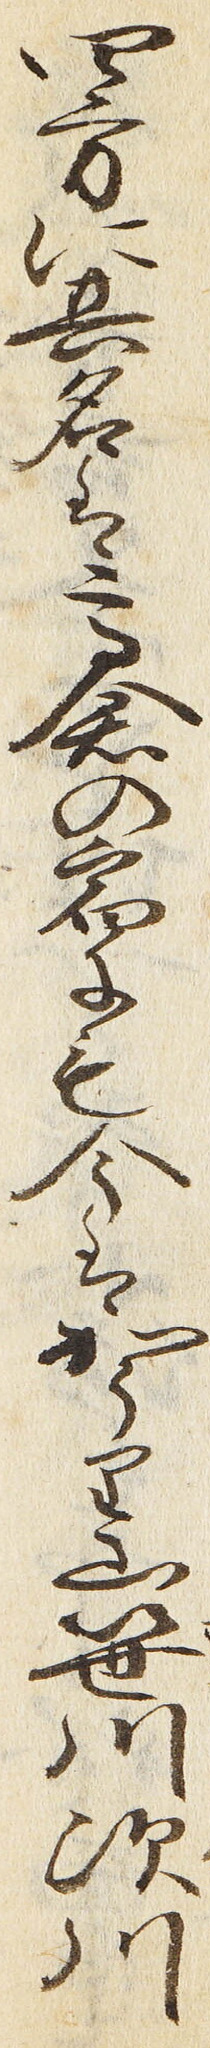四方に其名は高倉の宿にも今はかうり山笹川須川
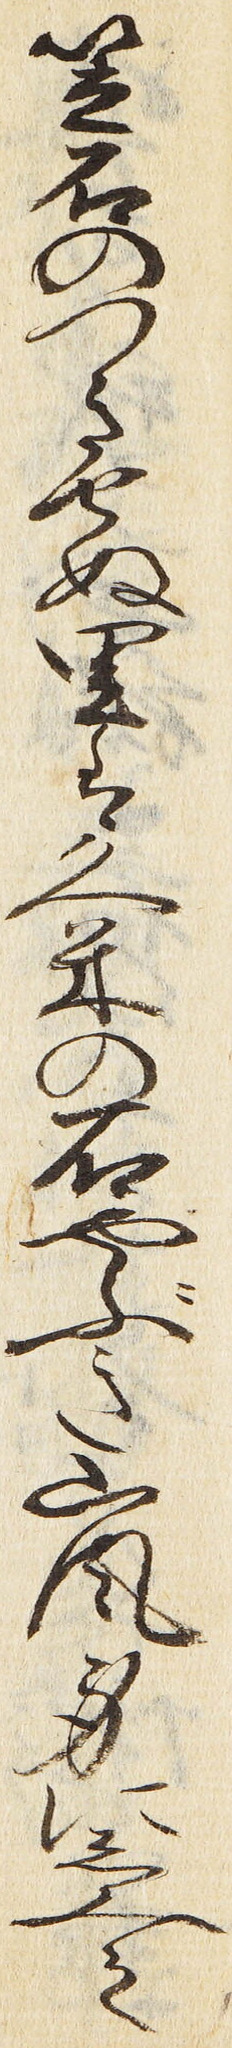笠石のつきせぬ里は久米の石やぶき嵐身にしみて
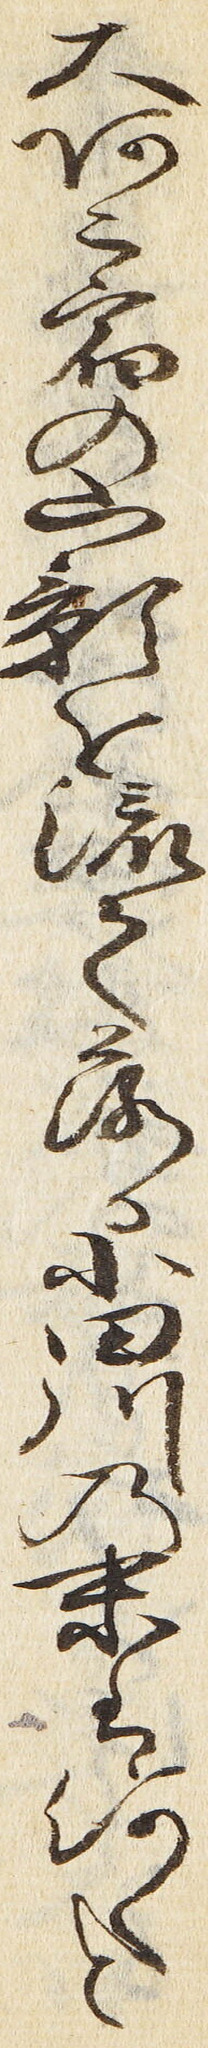大あこ宿の山影を流て落る小田川の末は何と
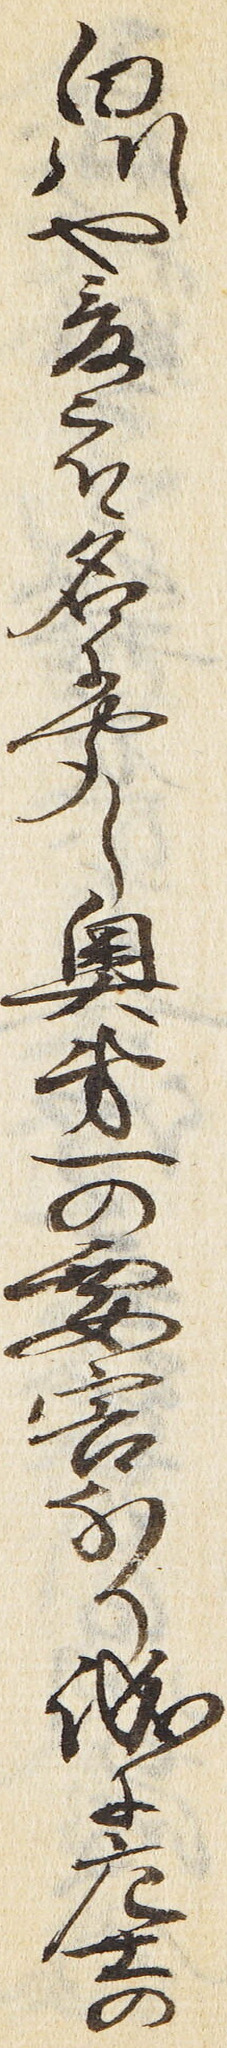白川や爰こそ名に聞し奥第一の要害なり誠に唐土の
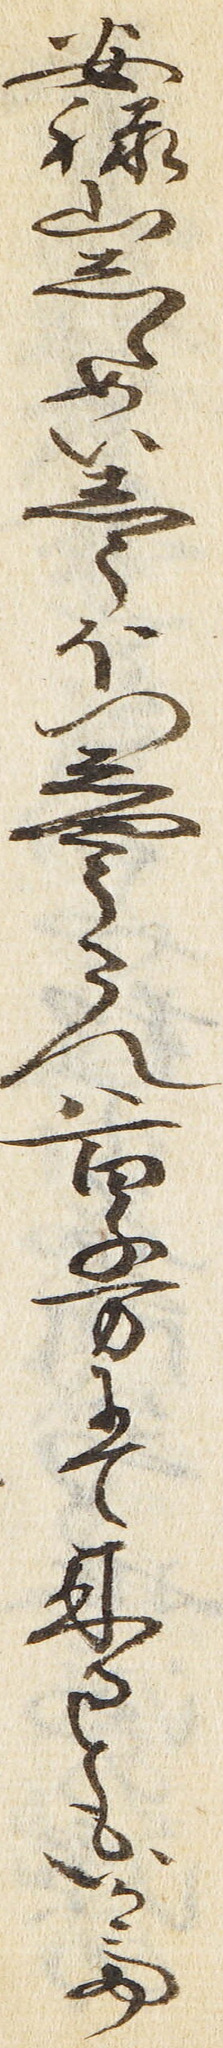安禄山しゝめいしうほつしやうこんは百千万にて来るともいかて
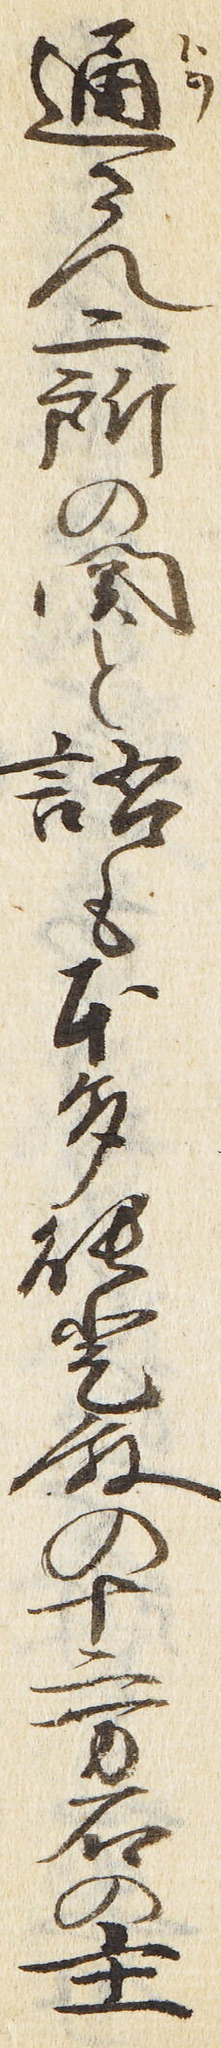通さん二所の関と語も本多能登殿の十二万石の主
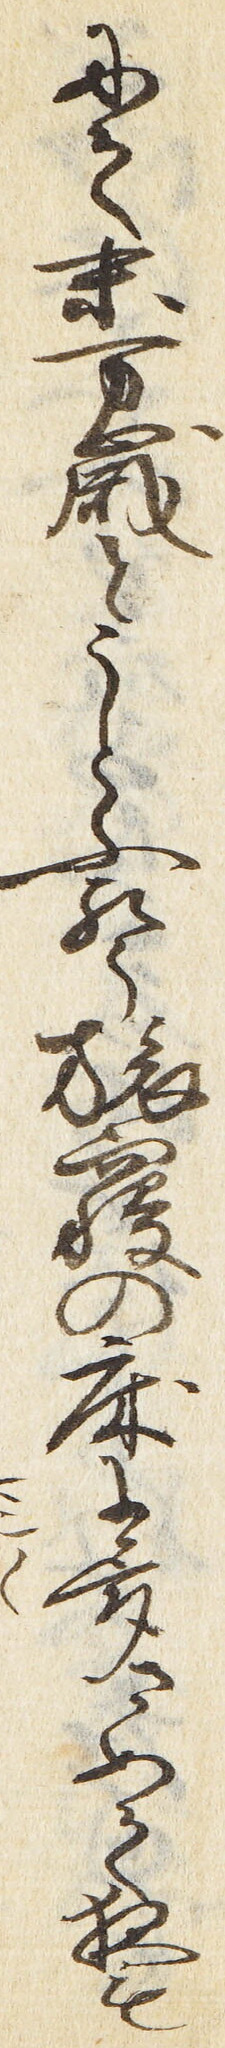にて末万歳とうとふ声旅寝の床に夢さめて夜も
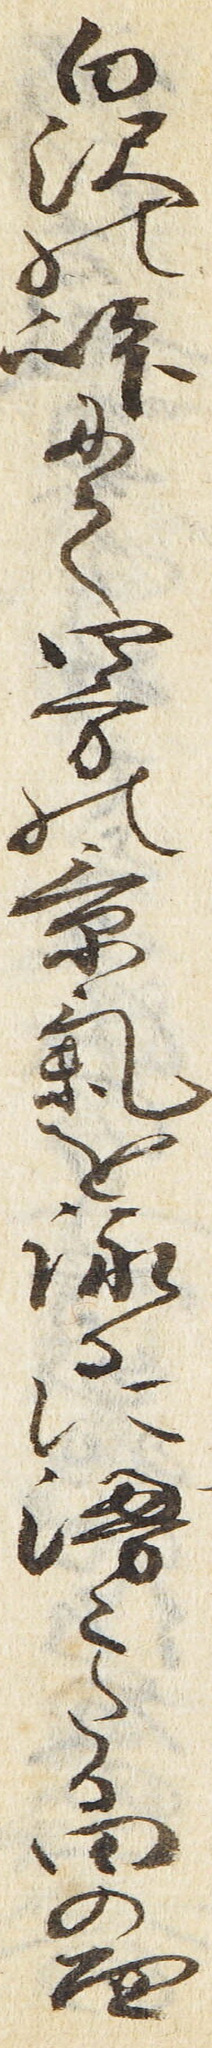白沢の峠にて四方の景気を詠るに漫々たる田の面
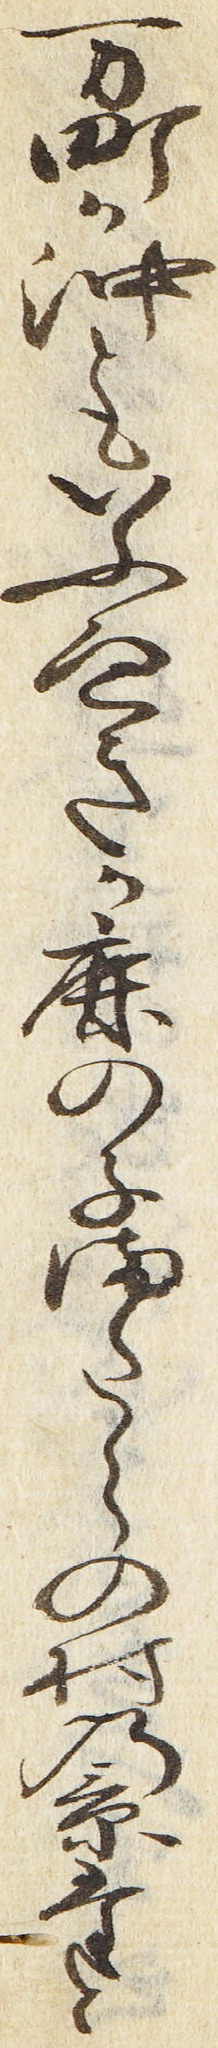万町か沖ともいふへきか鹿の子またらの村の景たと
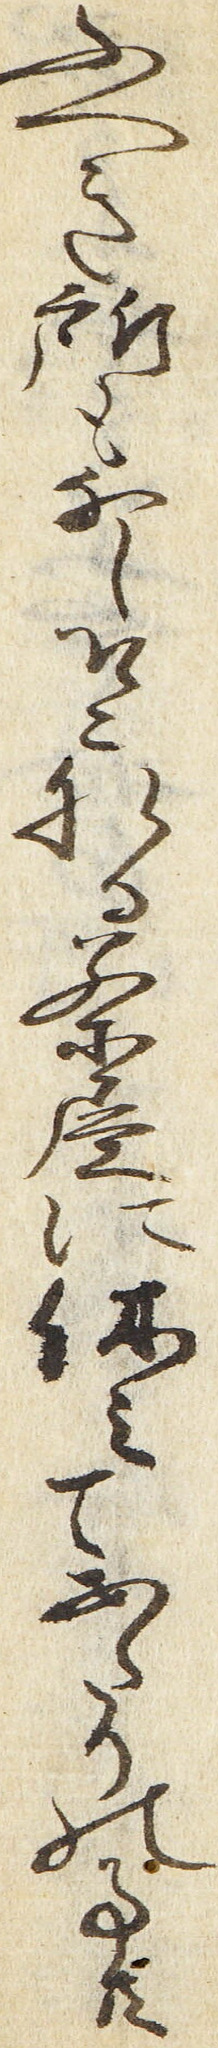ふへき所もなしそこなる茶屋に休みてあたりの事共

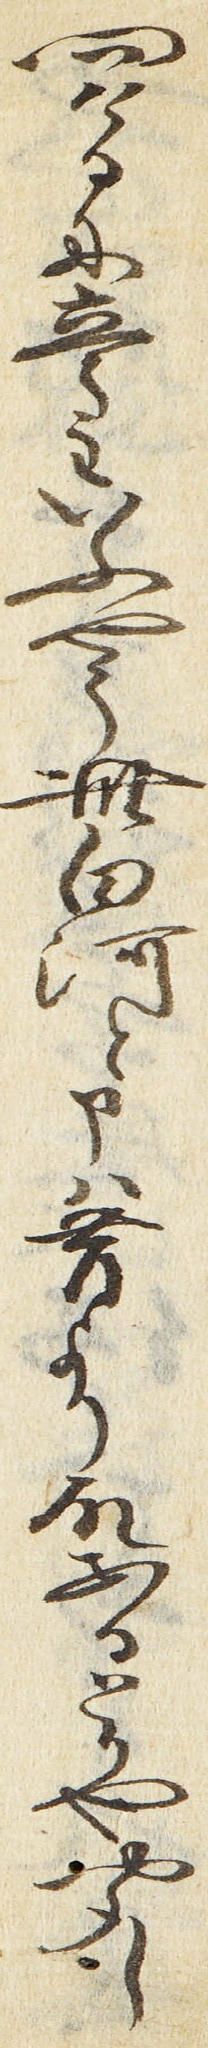問けるに亭主いふやう此白河と申は昔より故あるとかや聞し
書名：海陸世話日記
